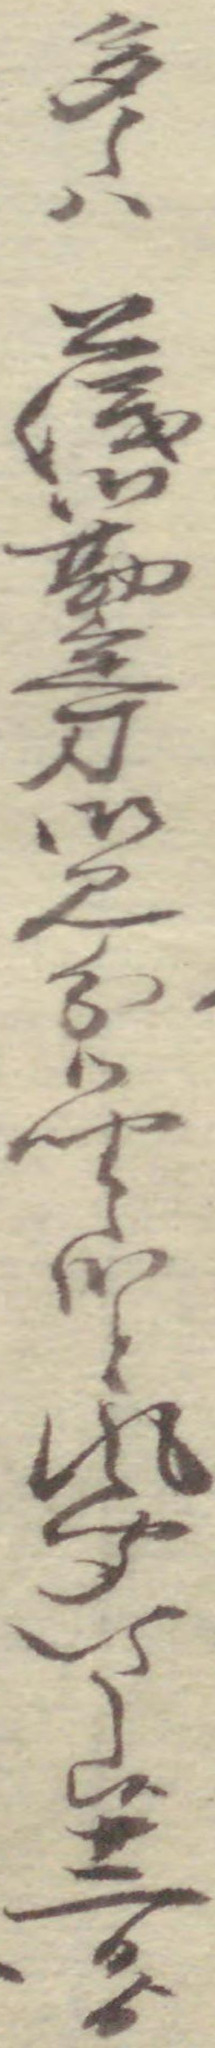多くハ公儀御勘定方御見分御座候哉と風聞いたし候十二日ゟ
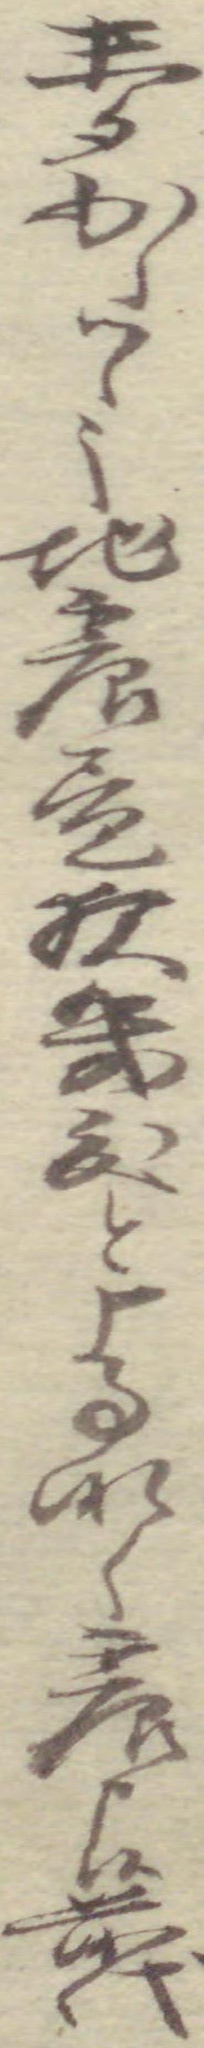未タ少〻ツヽ之地震昼夜幾度と申事なく震申候前代
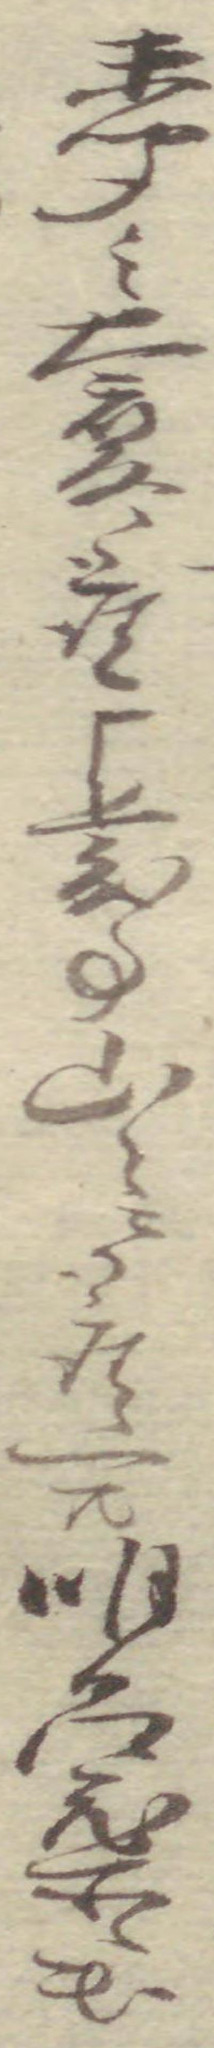未聞之大変ニ御座候申上度事山〻ニ御座候へ共明日郷蔵所へ出
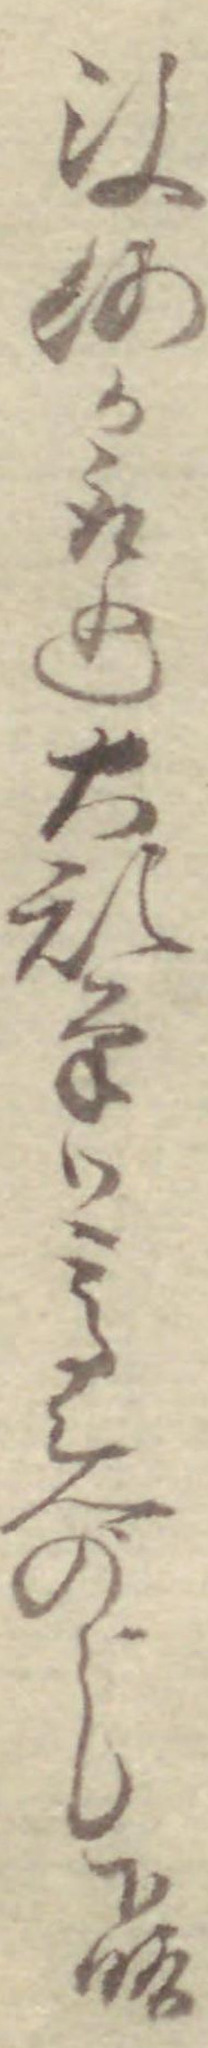役あり取込大乱筆御高免可被下候下略
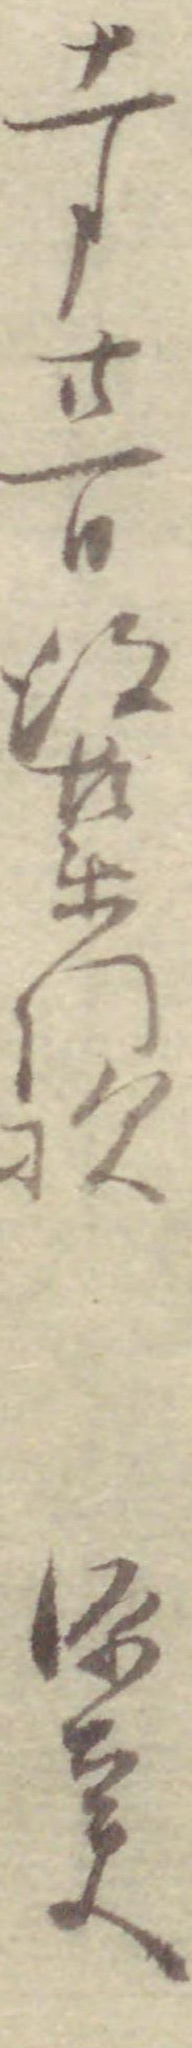十一月廿一日得左衛門様源大夫
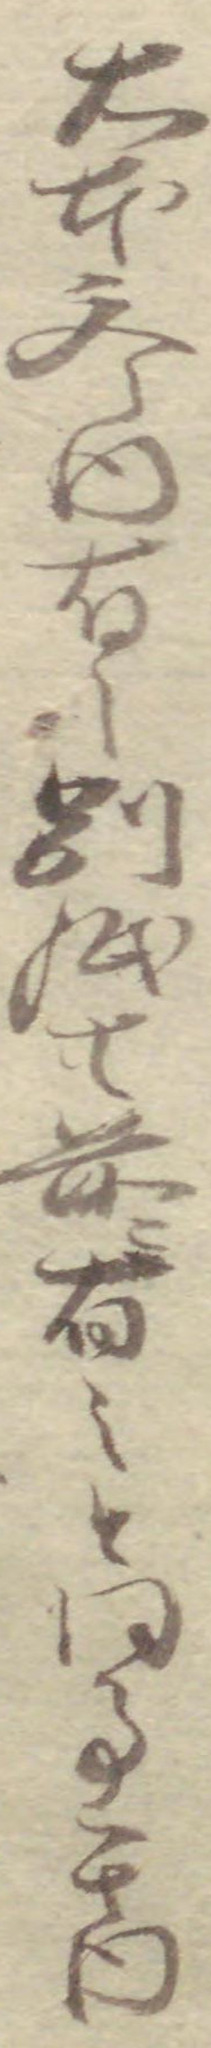右本文之内有之別紙は前ニ有之と同事其内
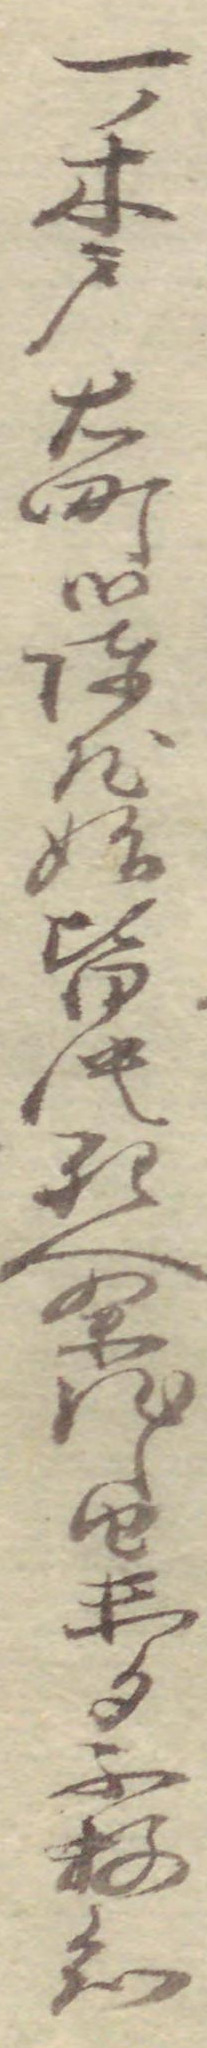一ノ木戸右町御陣屋始皆潰死人余程之由未タ不数知
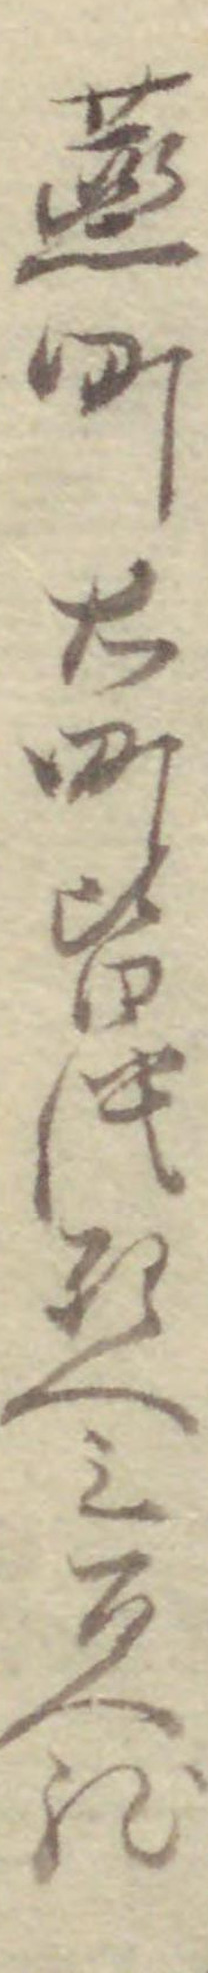燕町右町皆潰死人三百人程
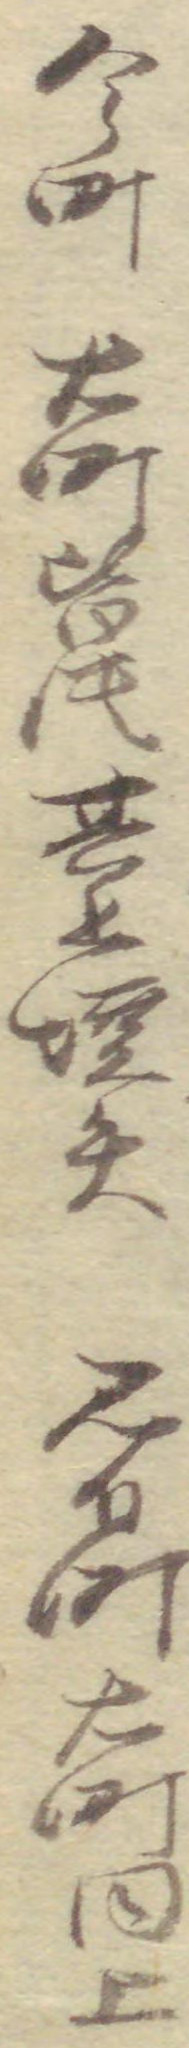今町右町皆潰其上焼失見付町右町同上

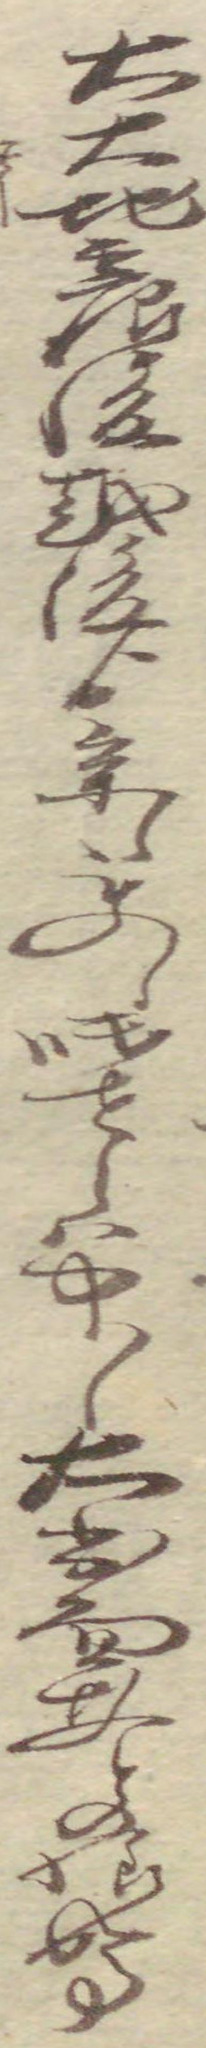右大地震後越後ゟ参候ものゝ咄せしハ中〳〵右書面なとの様成事
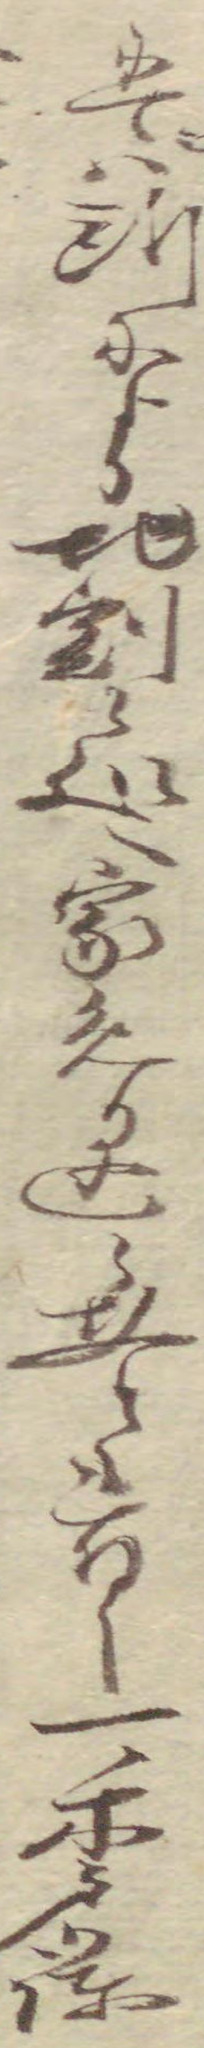にてハ無之所により地割之処へ家めり込候なとも有之一ノ木戸御陣
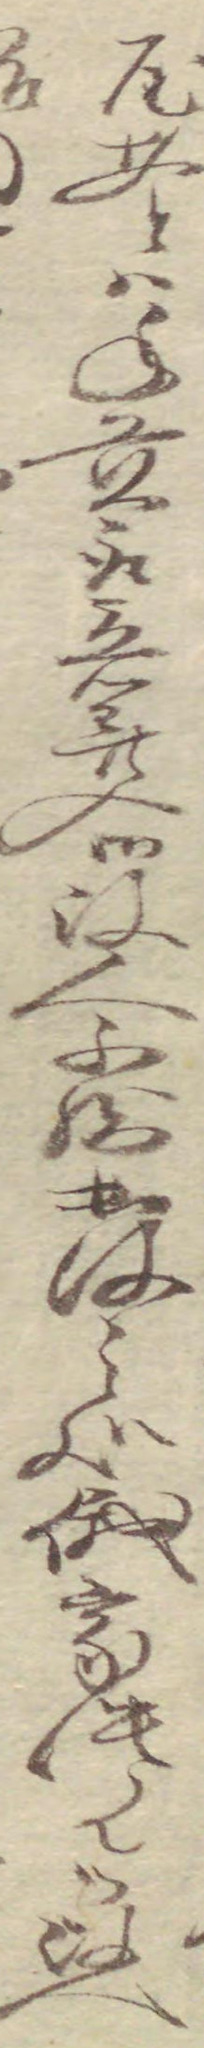屋なとはハ年貢取立算入御役人不残出役之処俄家潰ニて御役人
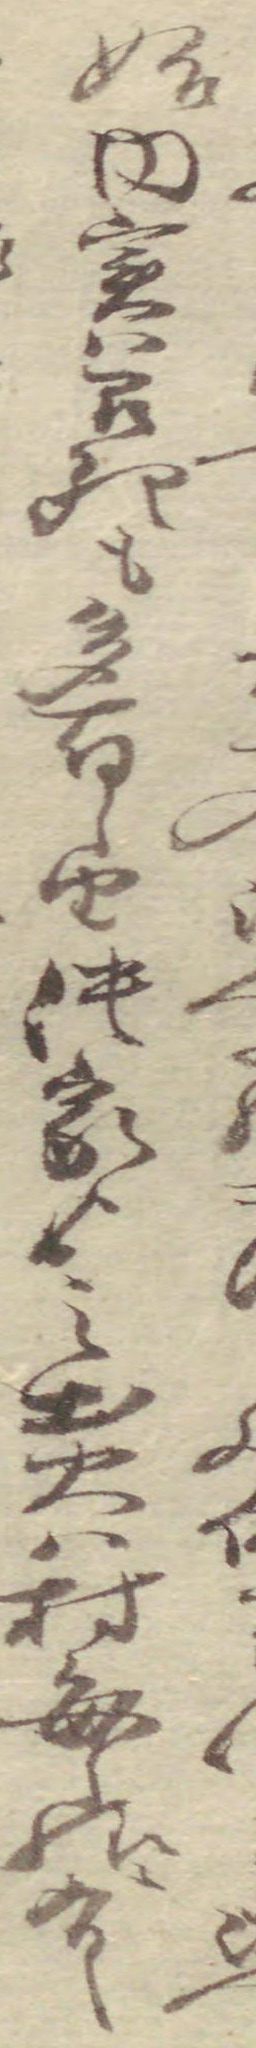始内実ハ即死も多有之由潰家ゟ之出火ハ村毎之様ニ有之
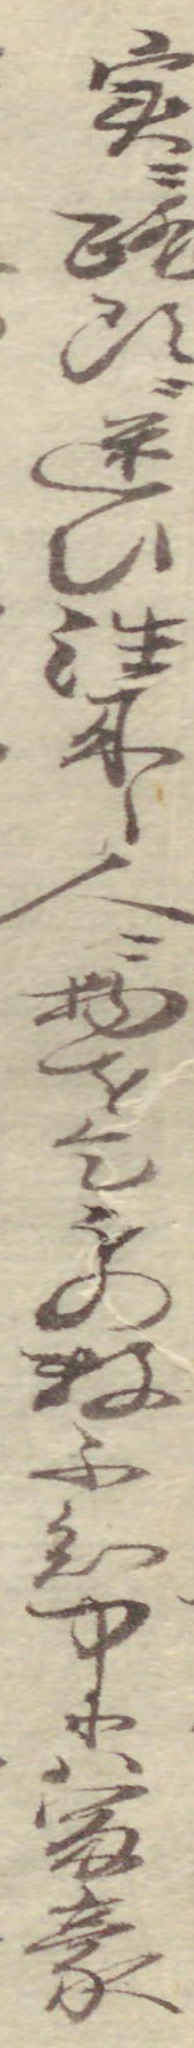実ニ路頭ニ迷ひ往来之人ニ物を乞もの数不知中にハ富豪
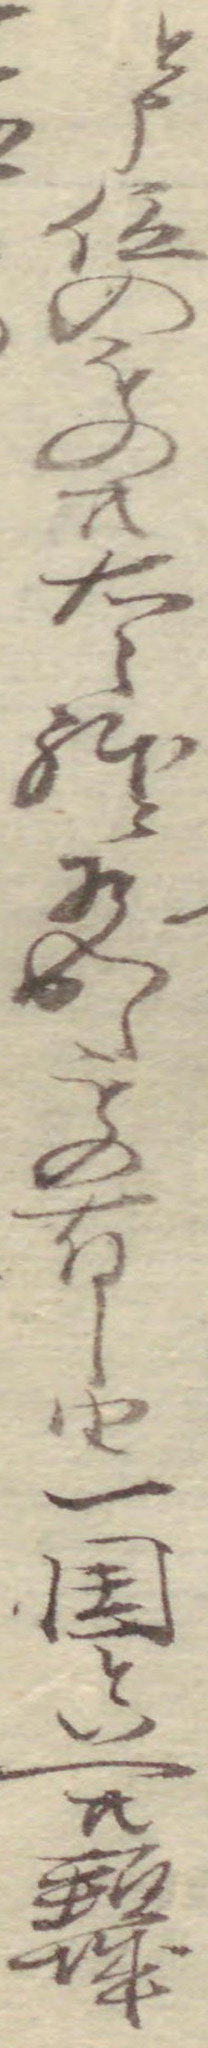と申位のもの共右之体ニ相成候もの有之由一国といへ共頚城
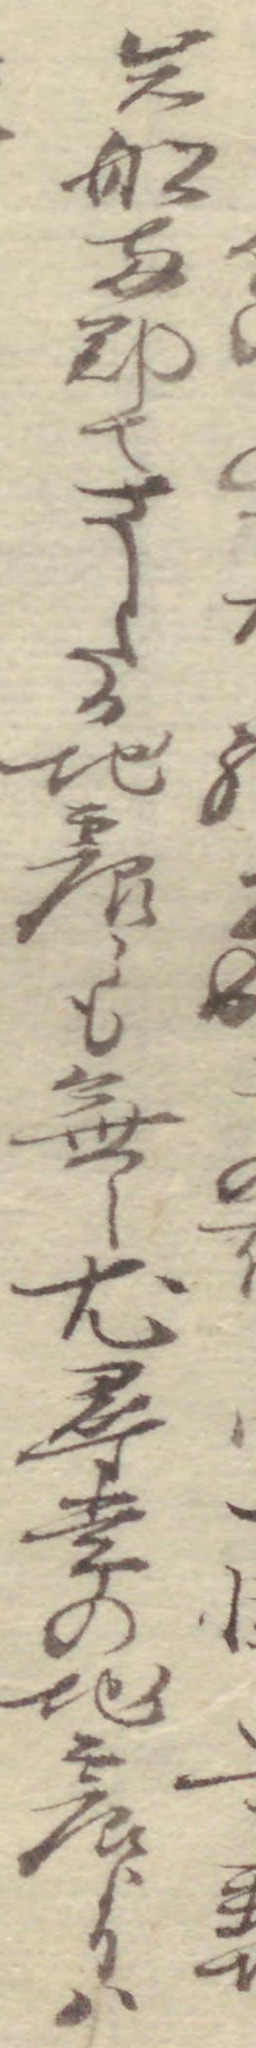岩船両郡はさしたる地震ニも無之尤尋常の地震よりハ
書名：鶯宿雑記. 巻199-200
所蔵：国立国会図書館 National Diet Library, JAPAN
